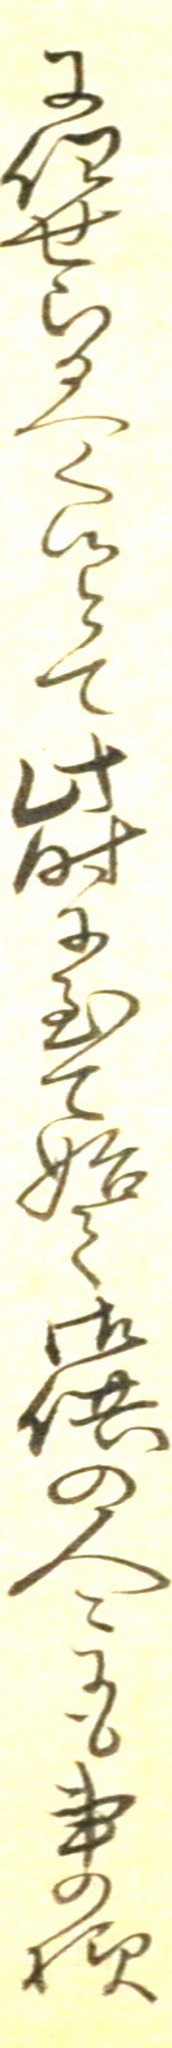に任せらるへく候とて此時に至て始て御供の人々にも事の様
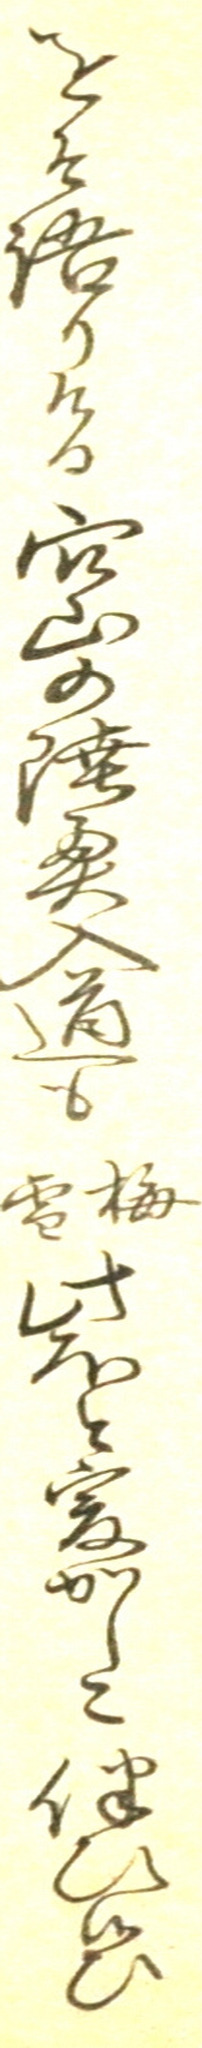をそ語りける穴山の陸奥入道も梅雪此ほと爰かしこ伴ひ候ひ
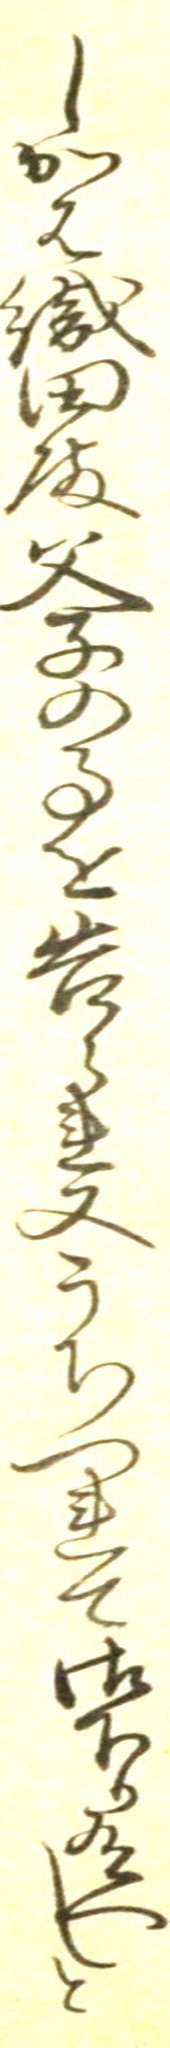しかは織田殿父子の事を告られ又うちつれて御下り有へしと
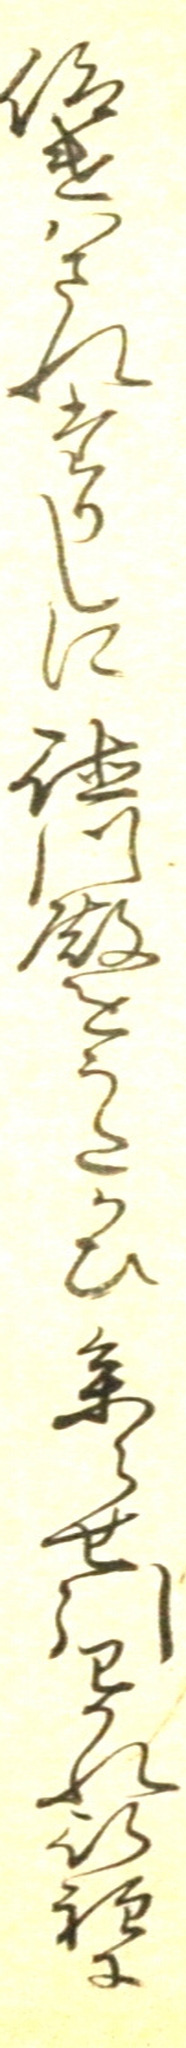仰遣はされたりしに徳川殿をうたかひ参らせ引わかれ行程に
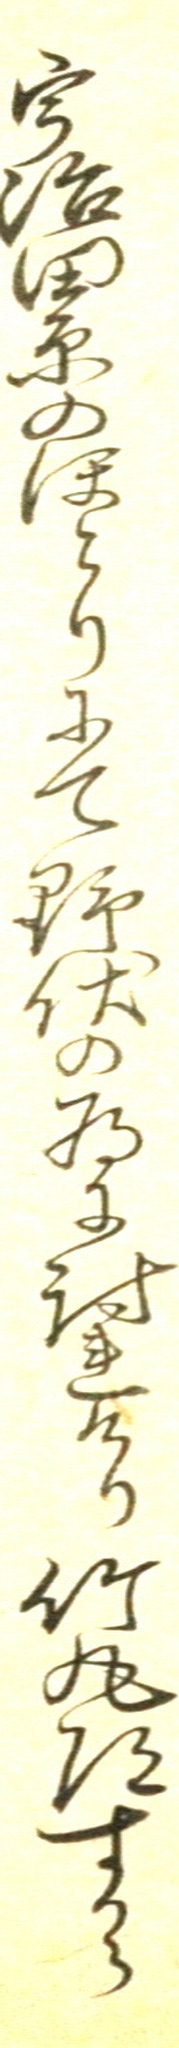宇治田原のほとりにて野伏の為に討れけり竹丸道すから
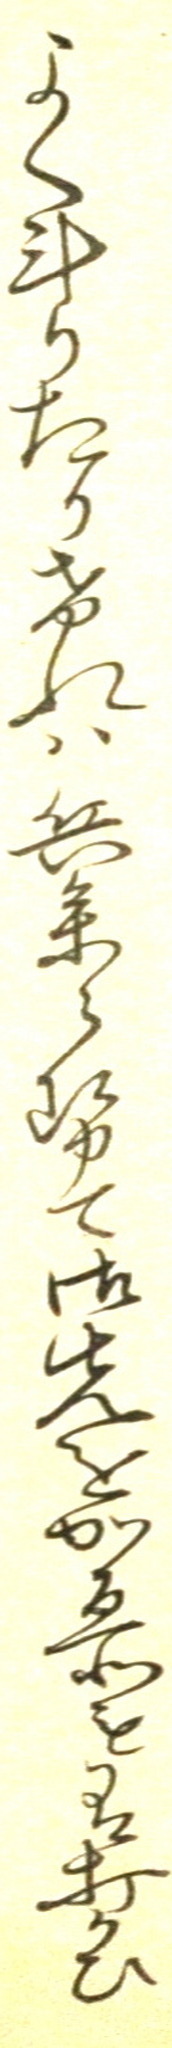よく計りたりけれは兵参らせて御先をかる所も有打かひ
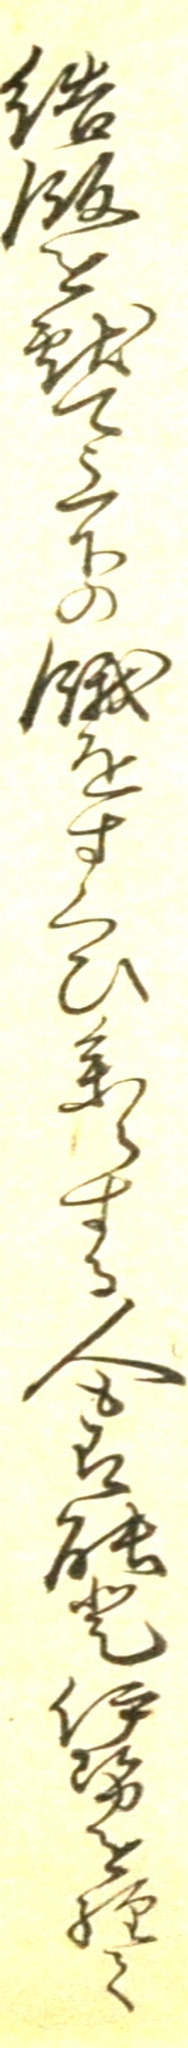結飯を献て上下の餓をすくひ参らする人も有能登伊勢を経て
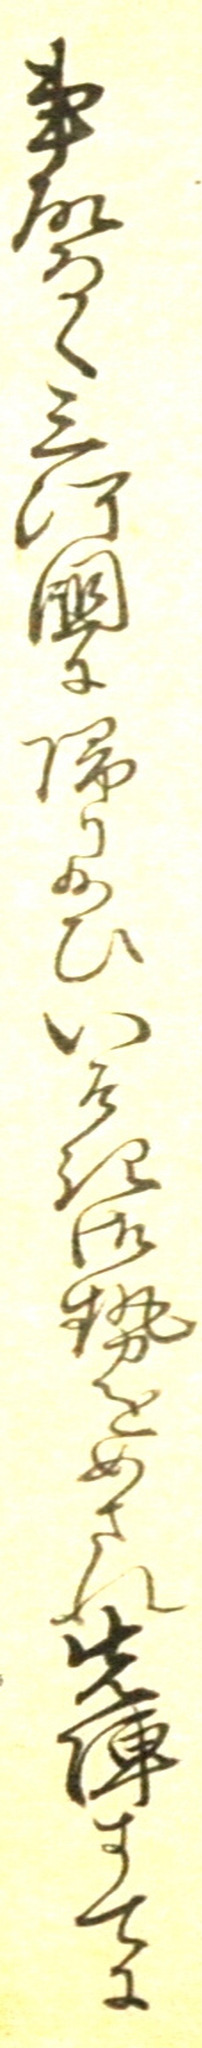事故なく三河国に帰り給ひいそき御勢をめされ先陣すてに
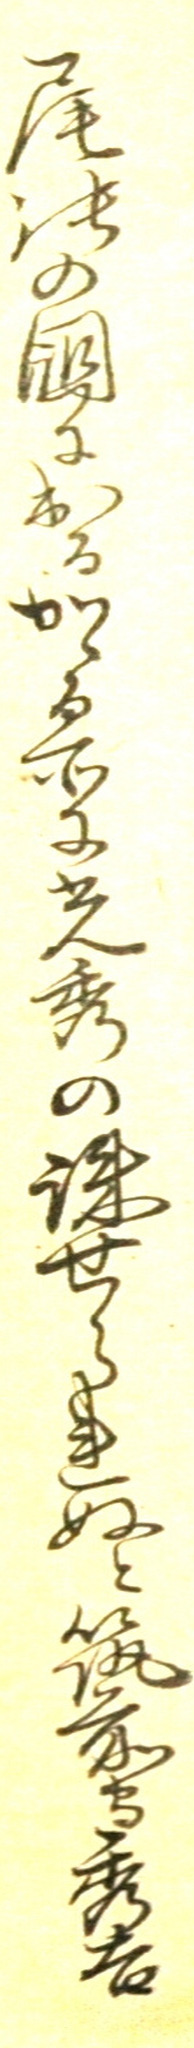尾張の国に出るかゝる所に光秀の誅せられぬと筑前守秀吉

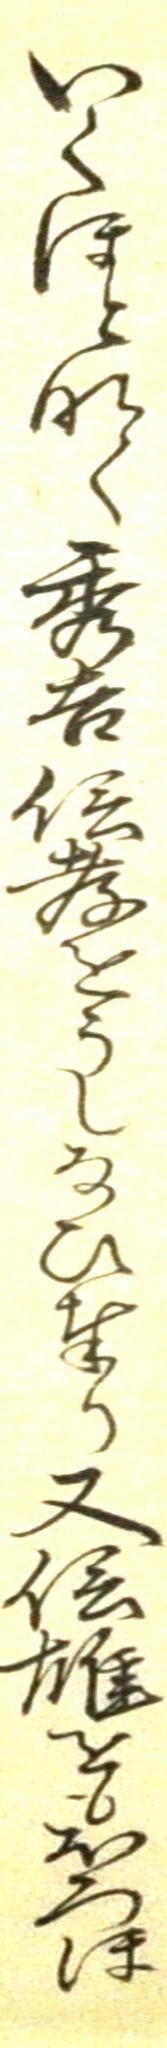いくほとなく秀吉信孝をうしなひ奉り又信雄をもほろほ
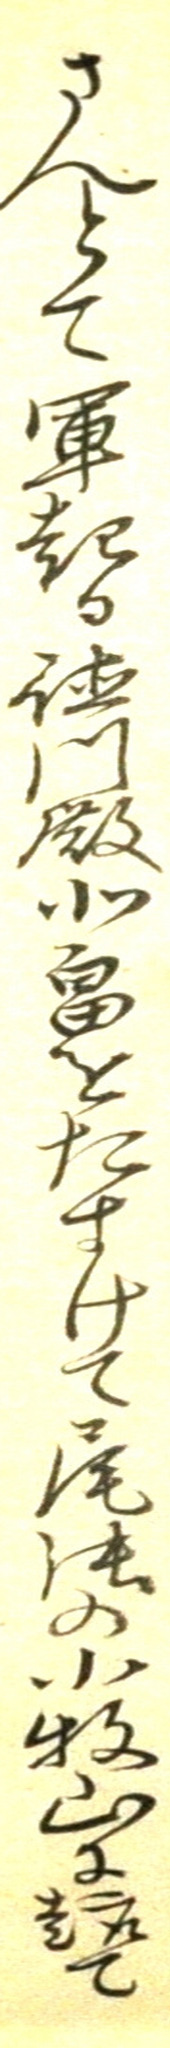さんとて軍起る徳川殿北畠をたすけて尾張の小牧山に趣て
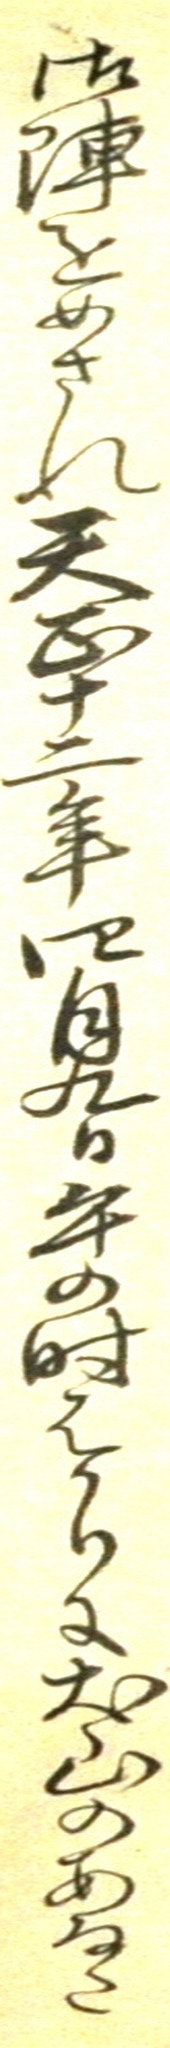御陣をめされ天正十二年四月九日午の時はかりに犬山のあなた
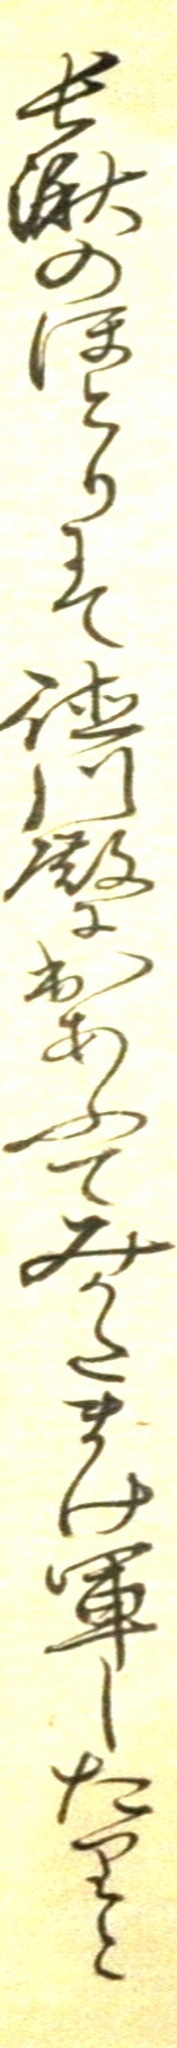長湫のほとりにて徳川殿に出あふてみかたまけ軍したりと
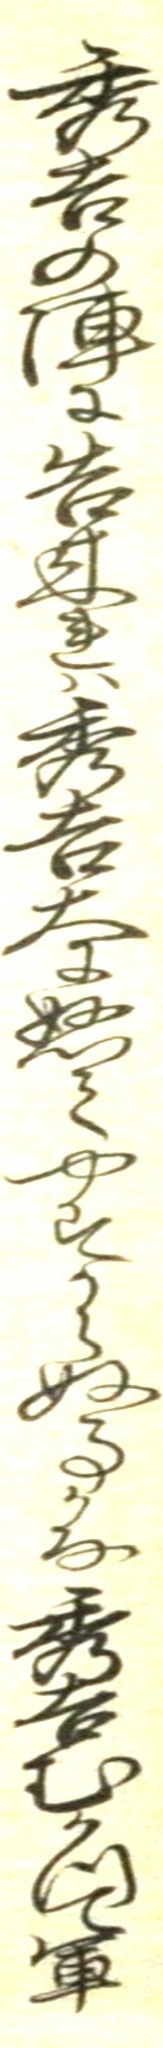秀吉の陣に告来れは秀吉大に怒てやすからぬ事かな秀吉むかつて軍
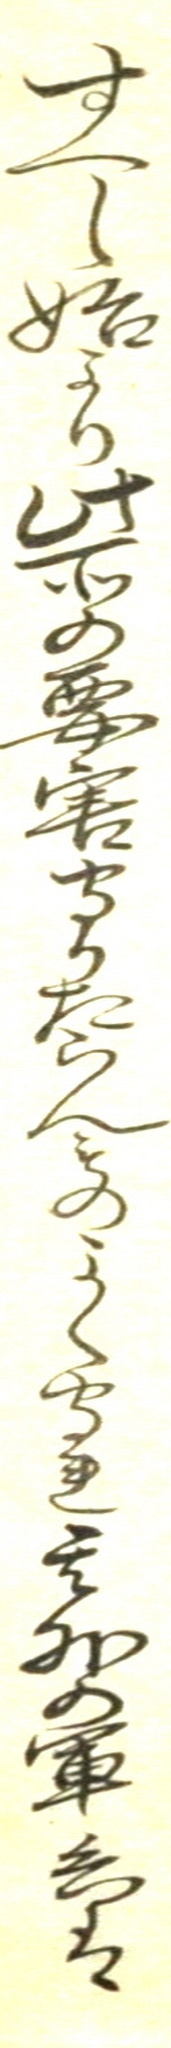すへし始より此所の要害守りたらんものよく守れ其外の軍兵は
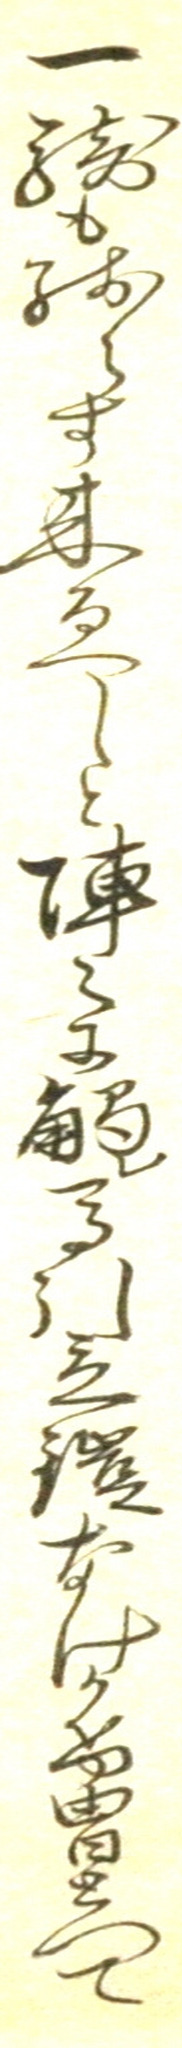一騎も残らす来るへしと陣々に触レ馬引立鎧なけかけ冑とつて
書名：藩翰譜（四・上）
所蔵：伊那市立高遠町図書館・合同会社AMANE
